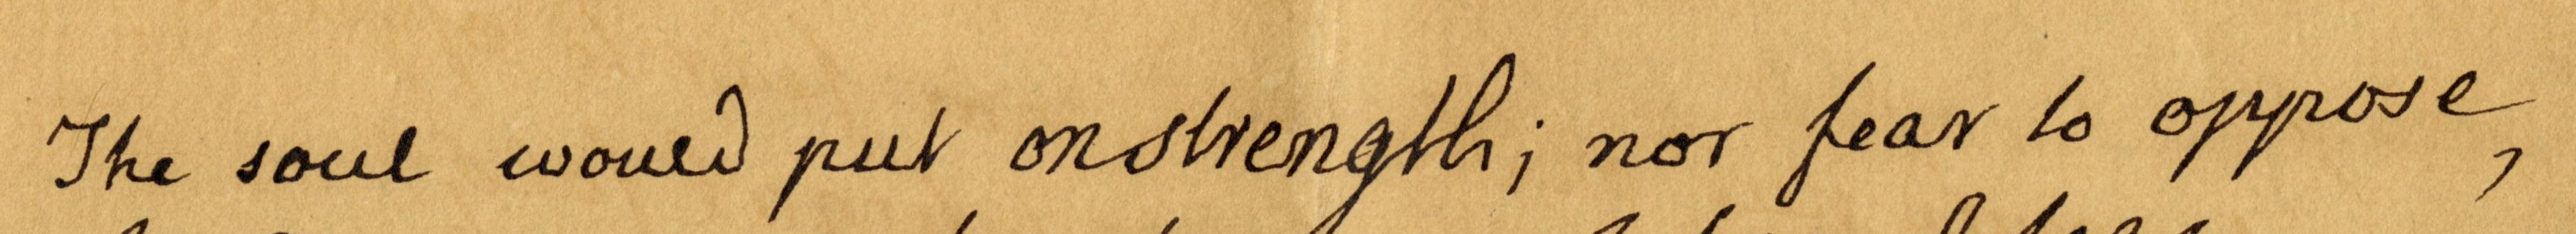The soul would put onstrength; nor fear to oppose,
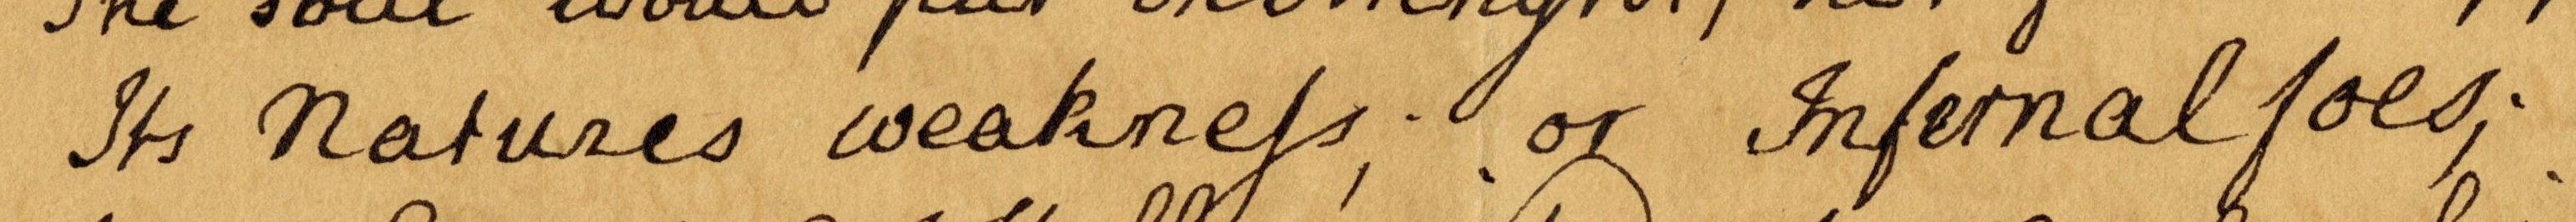Its Natures weakness; or Internal foes;
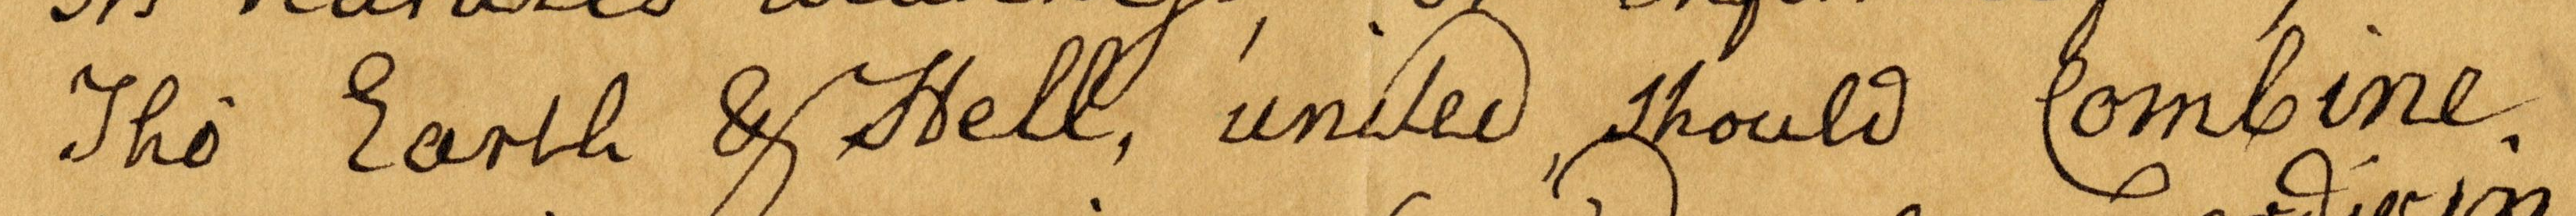Tho' Earth & Hell, united should Combine,
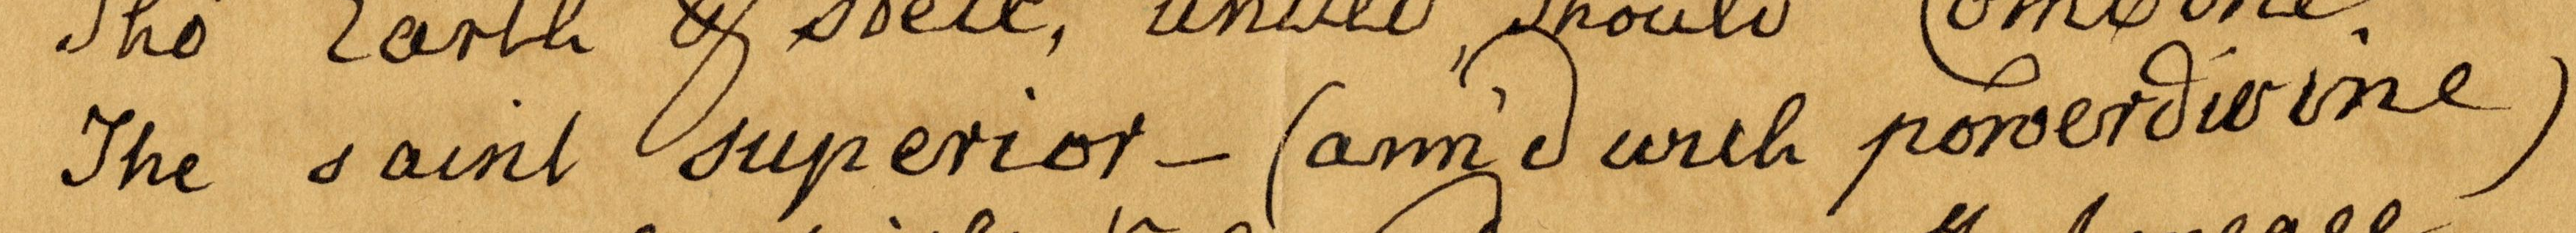The saint superior- (arm'd with powerdivine)
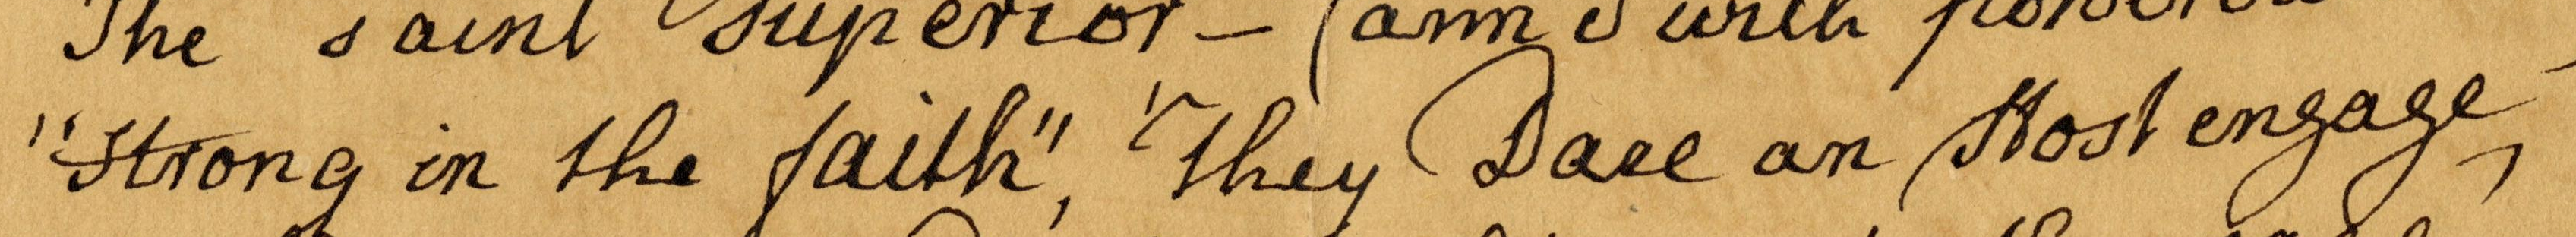"Strong in the faith", They Dare an Host engage,
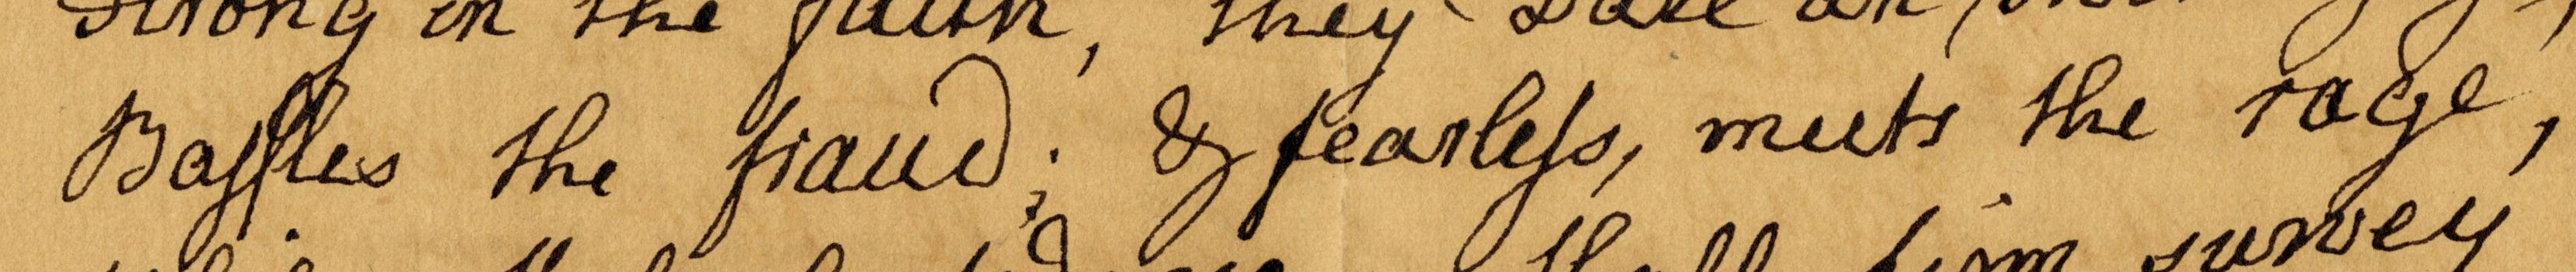Baffles the fraud; & fearless, must the rage,
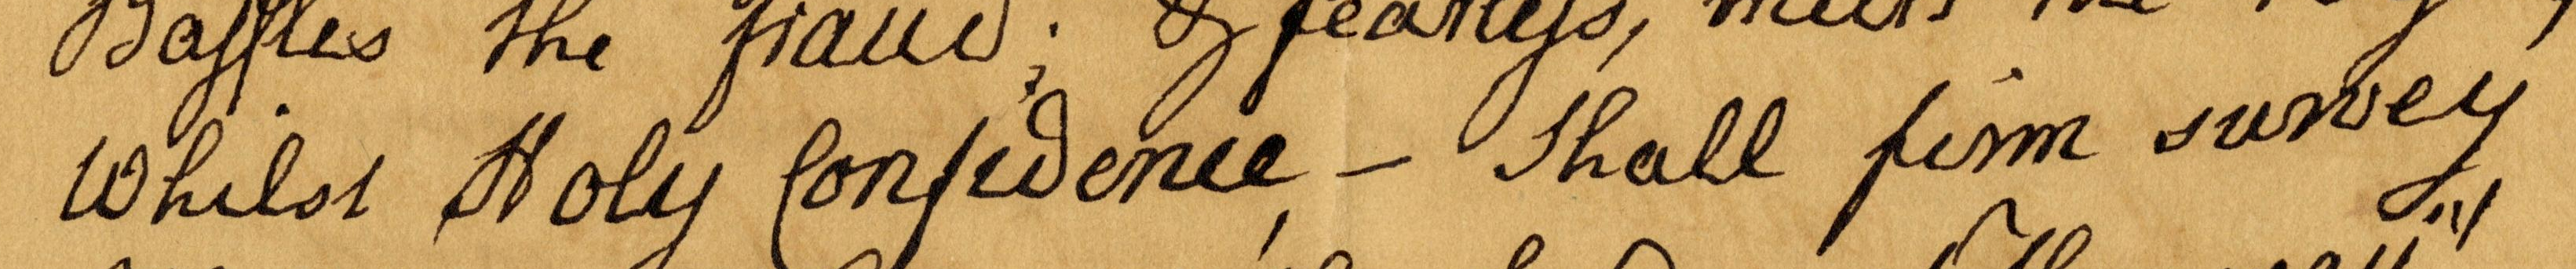Whilst Holy Confidence- shall firm survey,
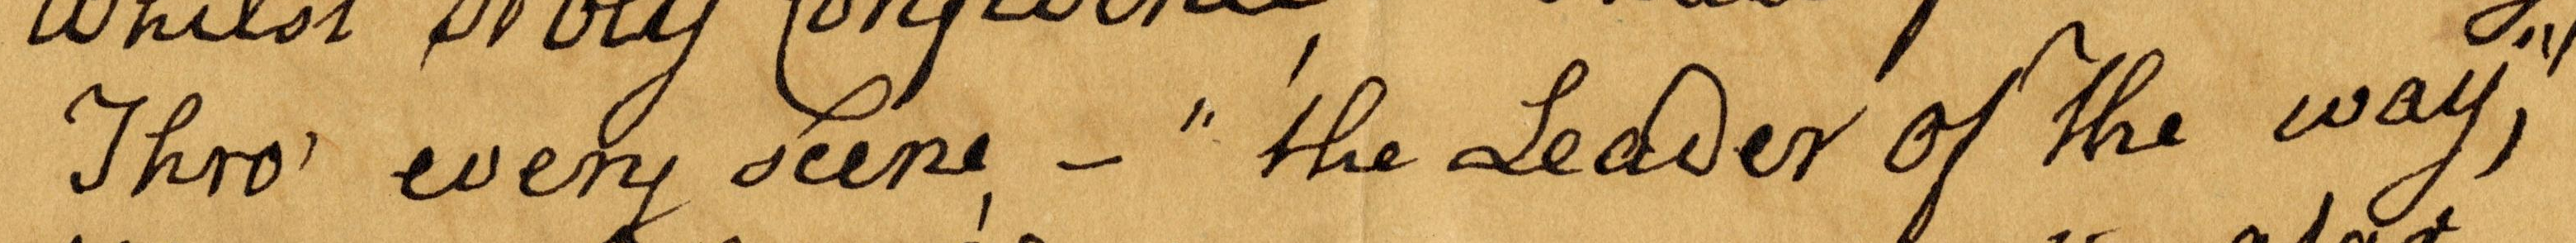Thro' every scene,- "the Leader of the way,"
